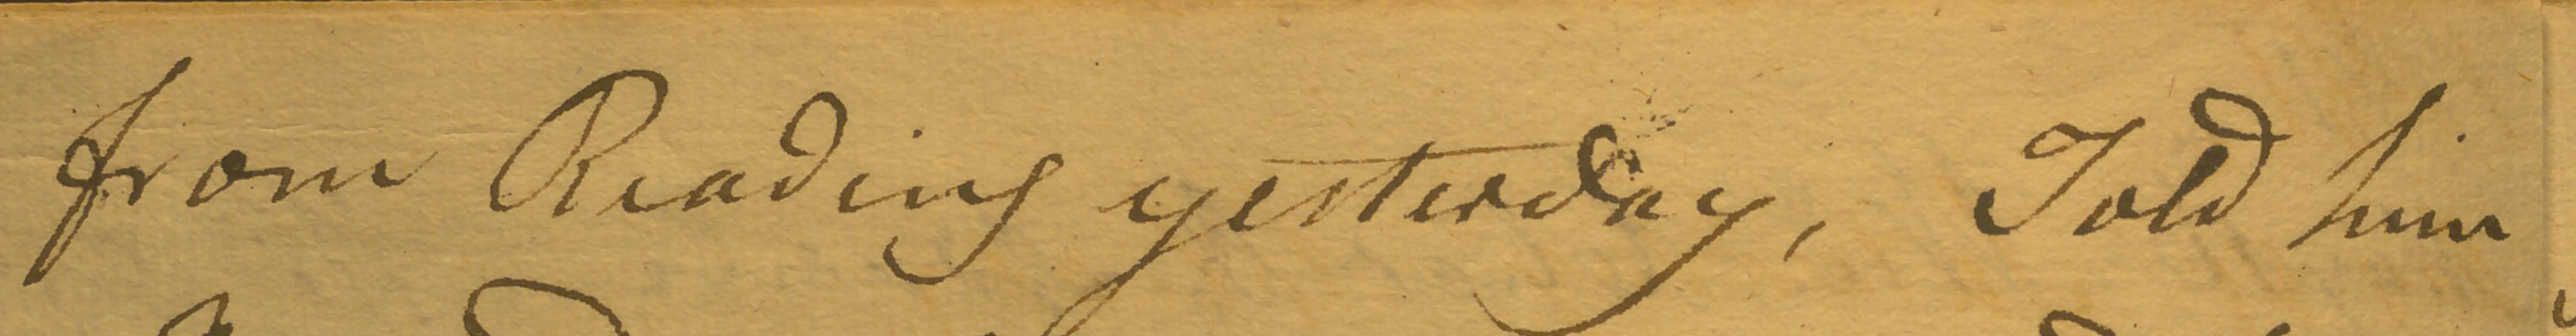from Reading yesterday, Told him
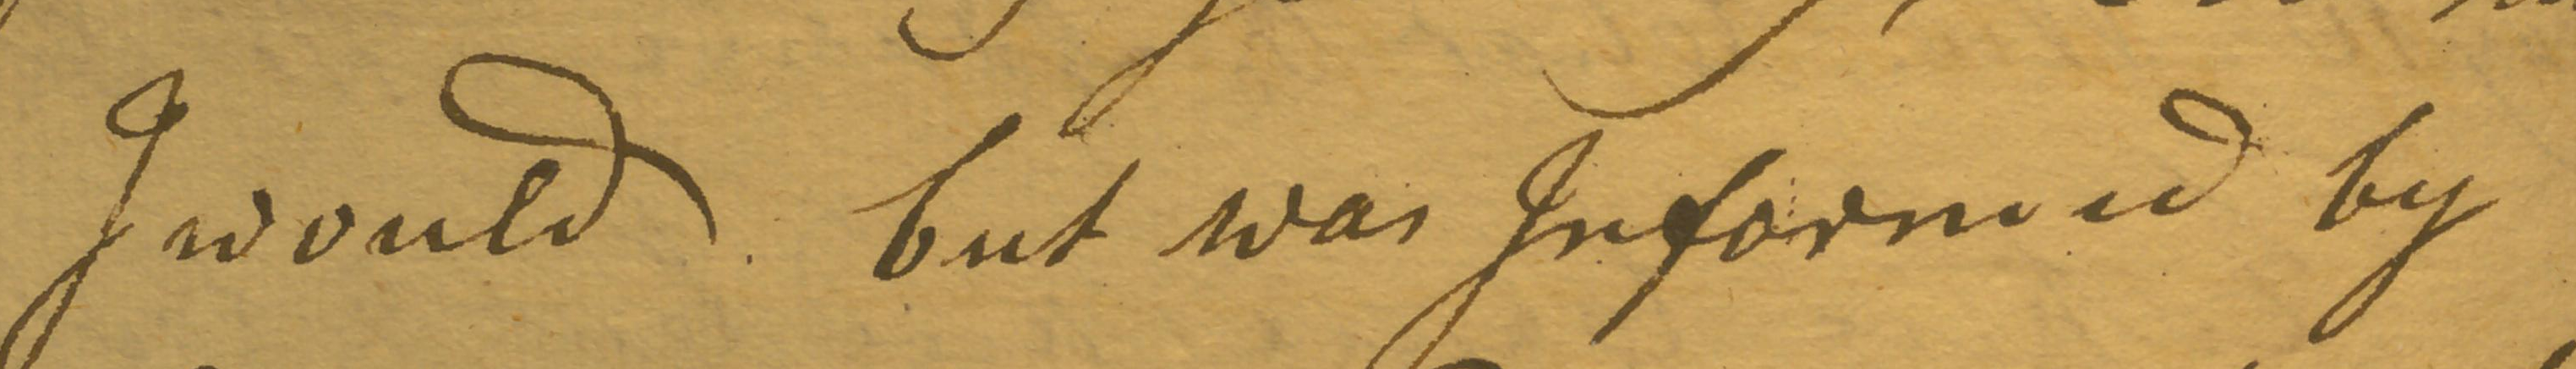I would but was Informed by
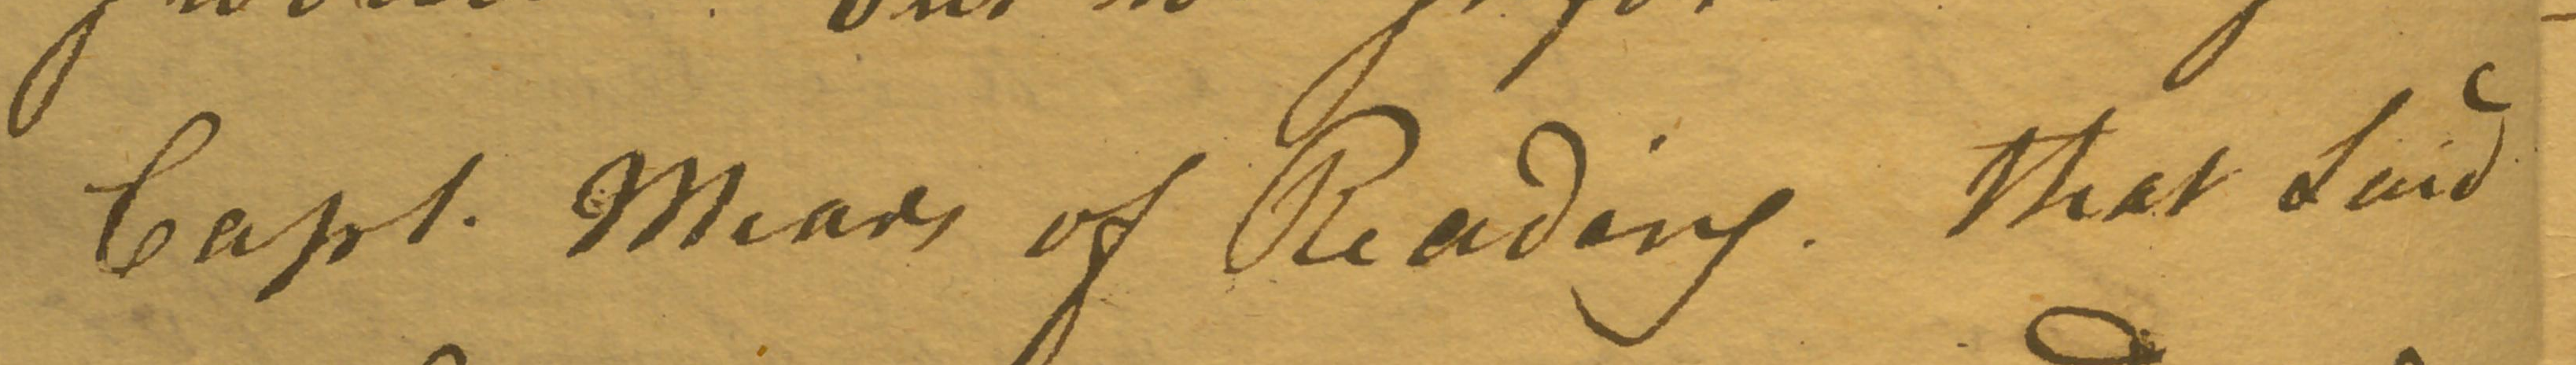Capt. Mears of Reading, that said
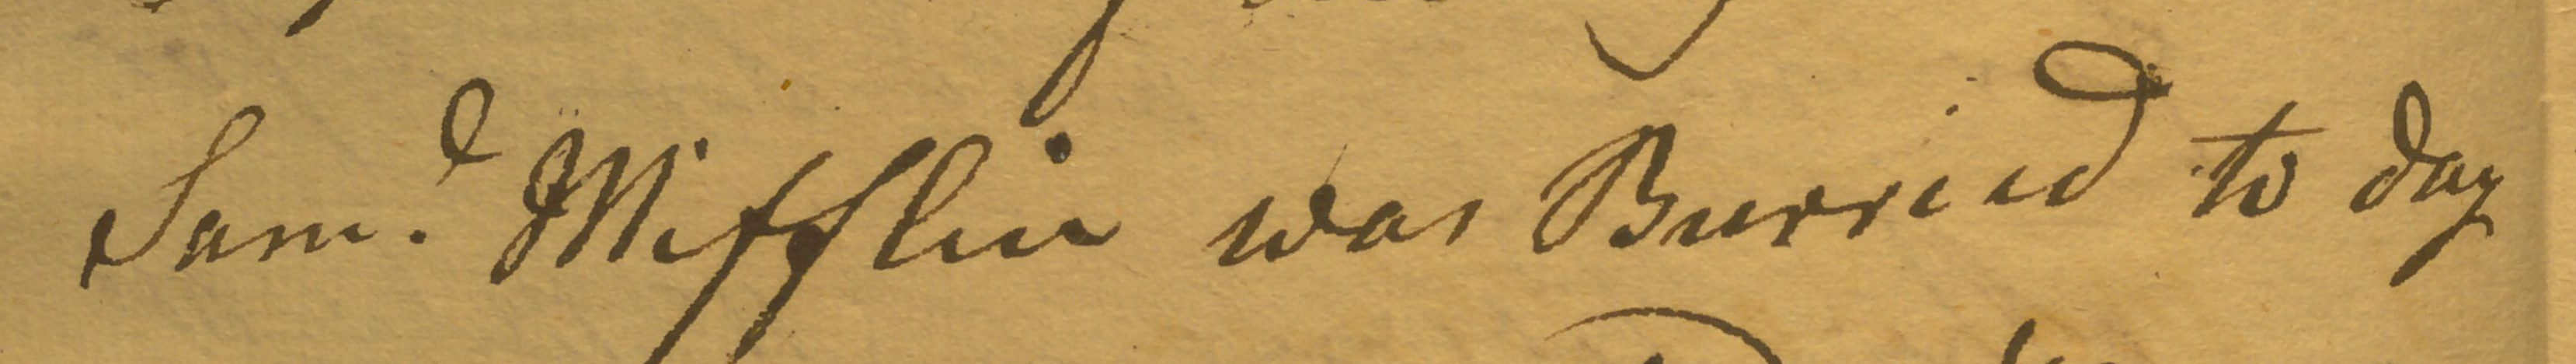Sam^l. Mifflin was Burried to day
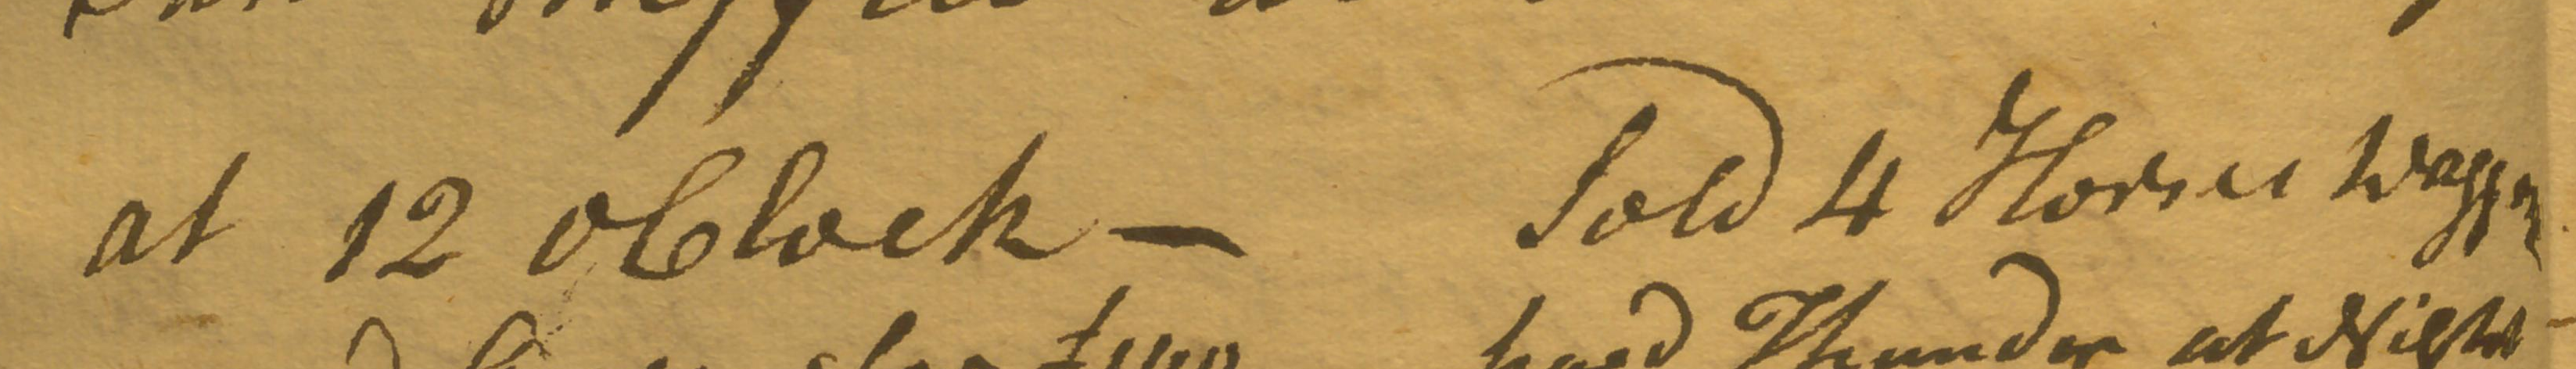at 12 oClock- Sold 4 Horse waggons
